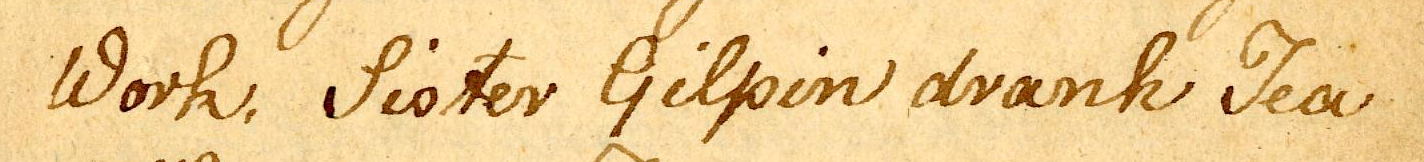Work. Sister Gilpin drank Tea
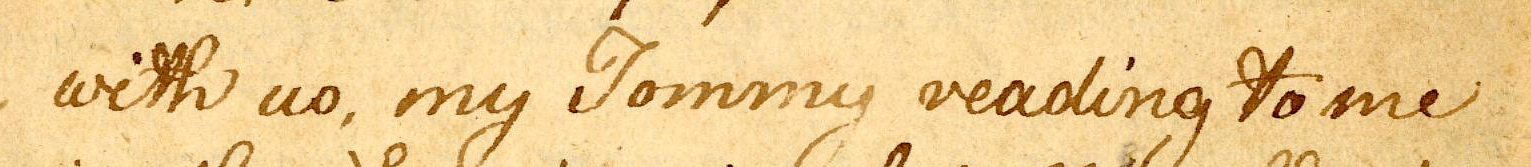with us, my Tommy reading to me
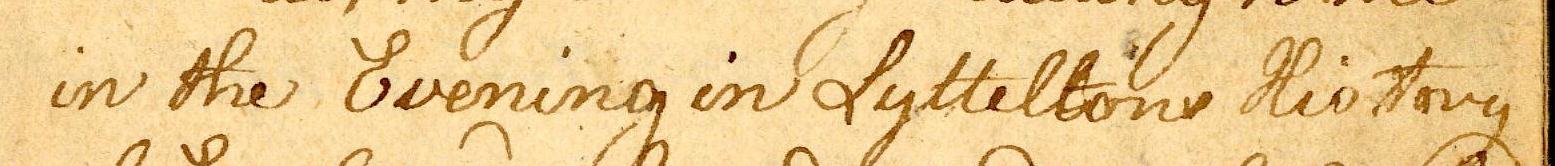in the Evening in Lytteltone History
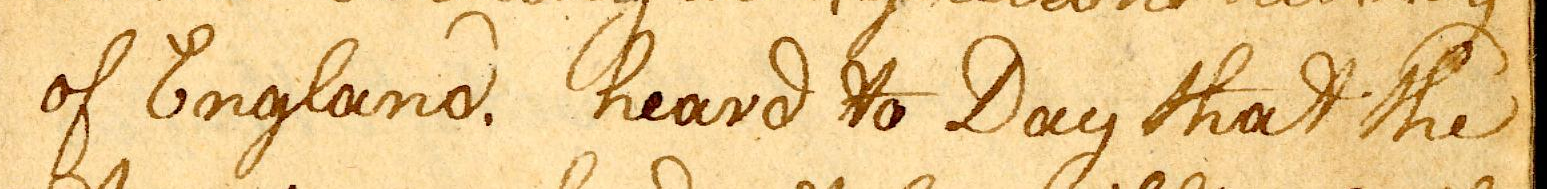of England. heard to Day that the
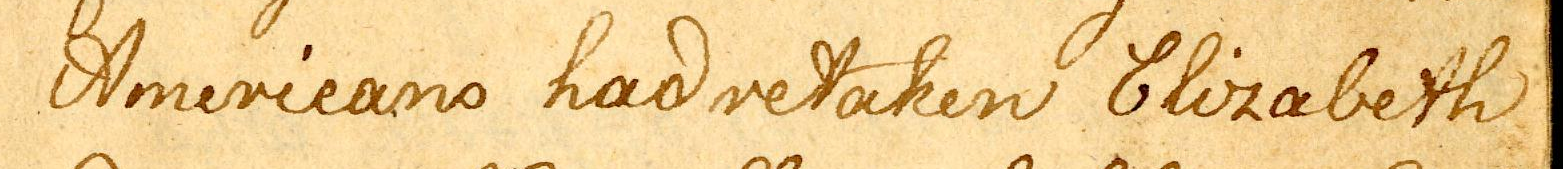Americans had retaken Elizabeth
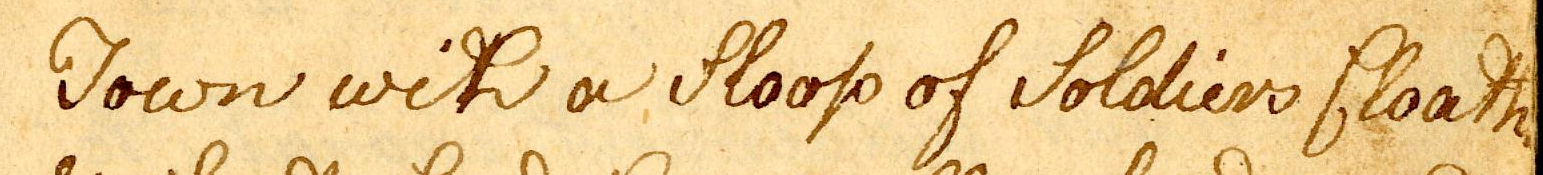Town with a Sloop of Soldiers Cloath
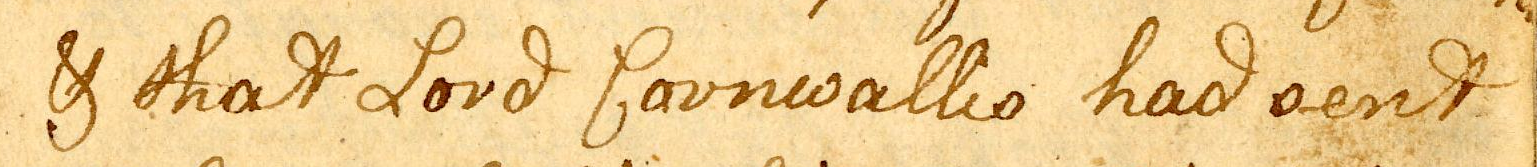& that Lord Cornwallis had sent
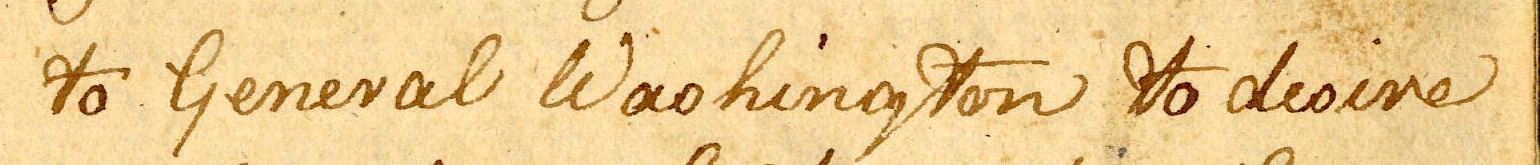to General Washington to desire
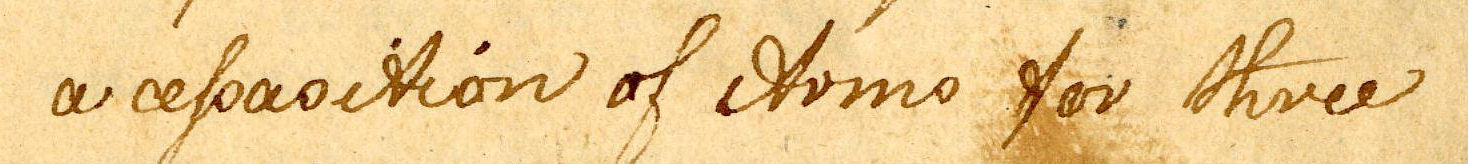a cessasition of Arms for three
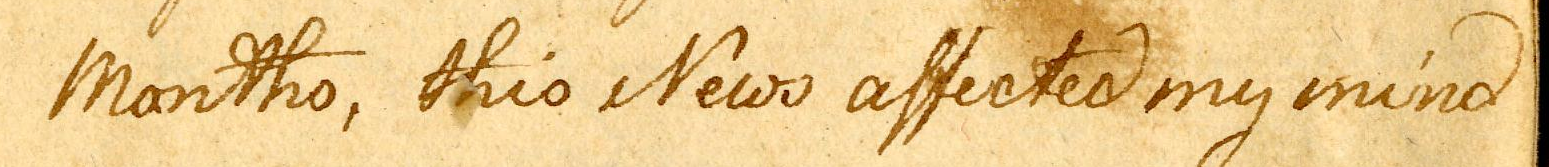Months, this News affected my mind
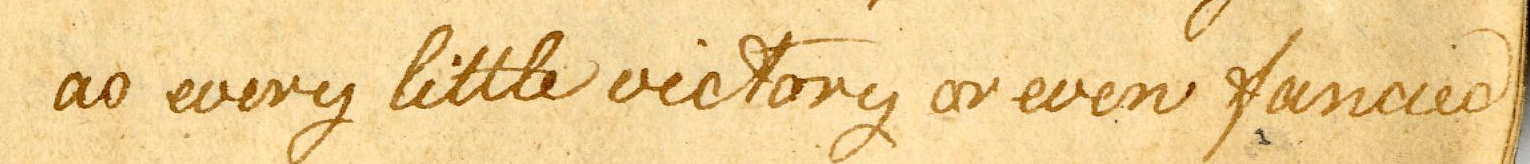as every little victory or even fancied
